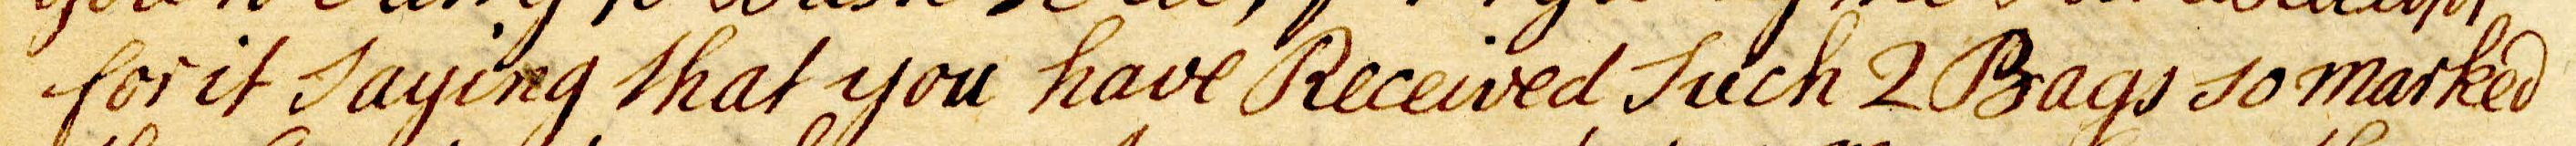for it Saying that you have Received such 2 Bags so marked
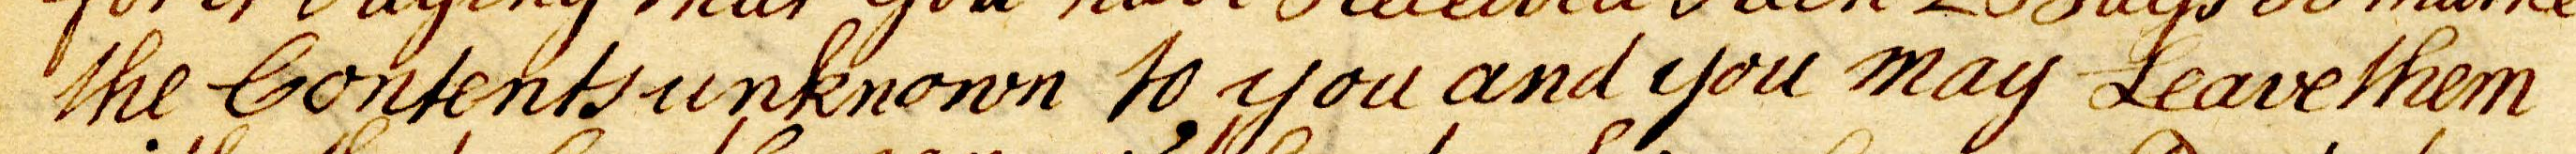the Contents unknown to You and You may Leave them
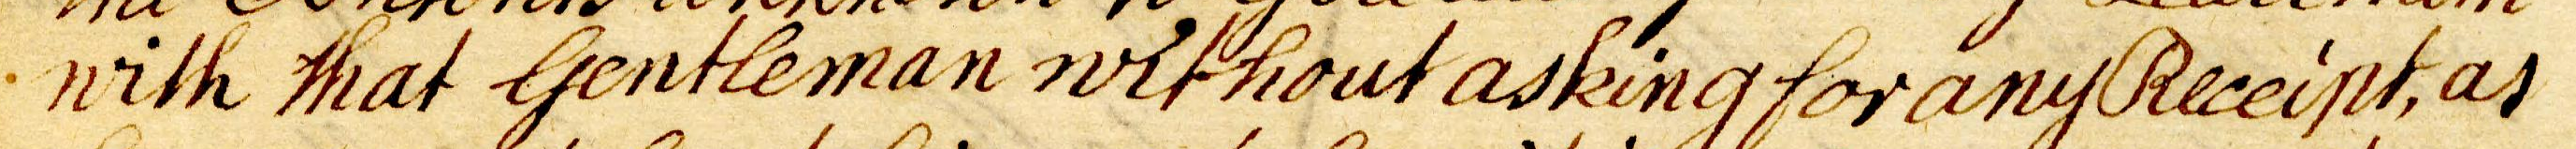with that Gentleman without asking for any Receipt, as
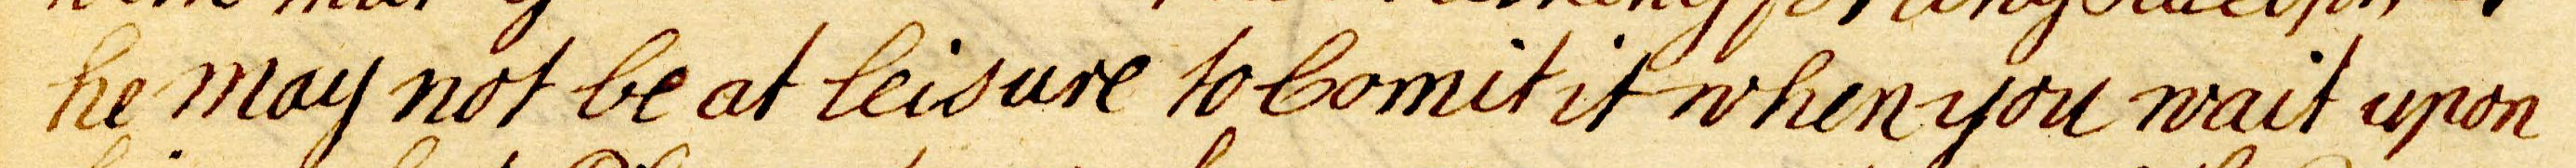he May not be at leisure to Comit it when you wait upon
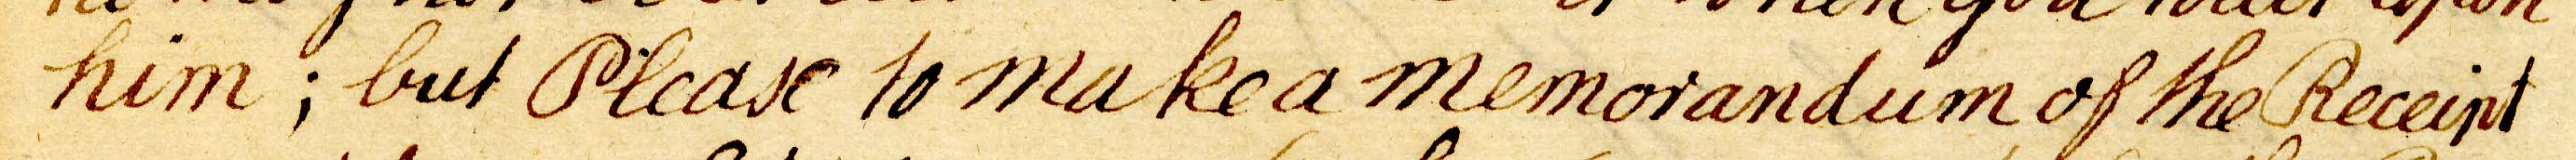him; but Please to make a memorandum of the Receipt
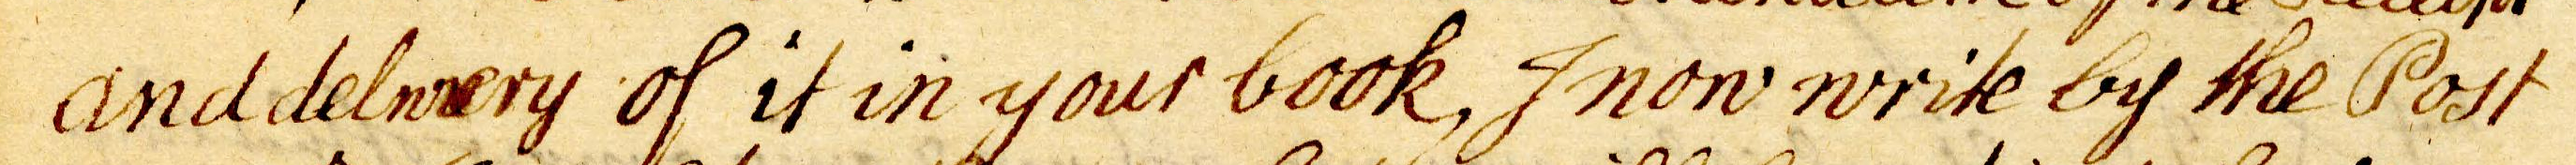and delivery of it in your book, I now write by the Post
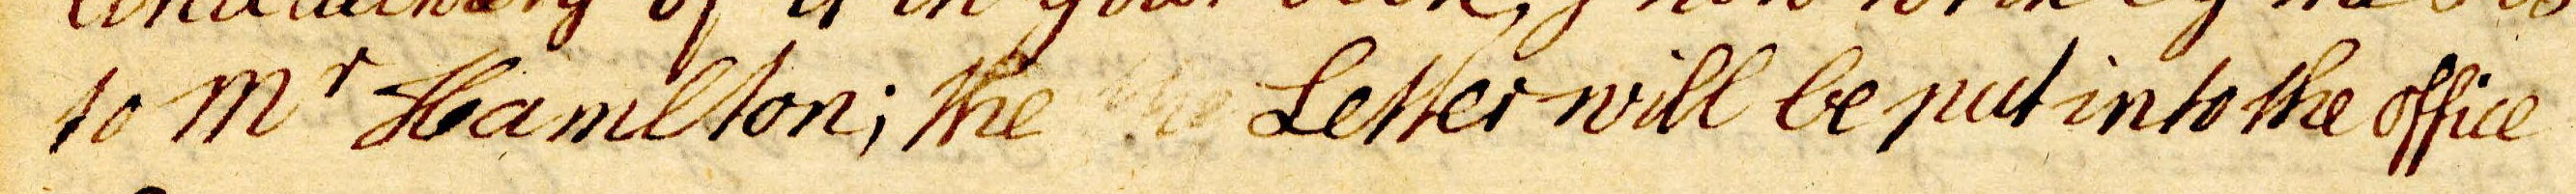to M^r Hamlton; the [the] Letter will be put into the office
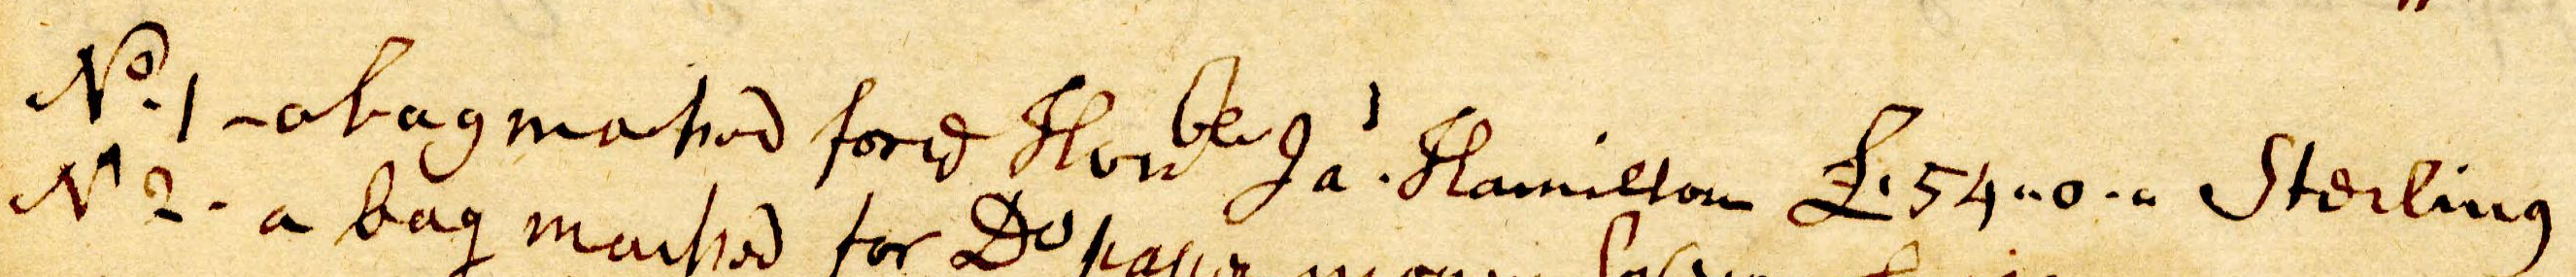N^o. 1- a bag marked for y^e Hon^ble Ja^s. Hamilton £54..0.4 Sterling
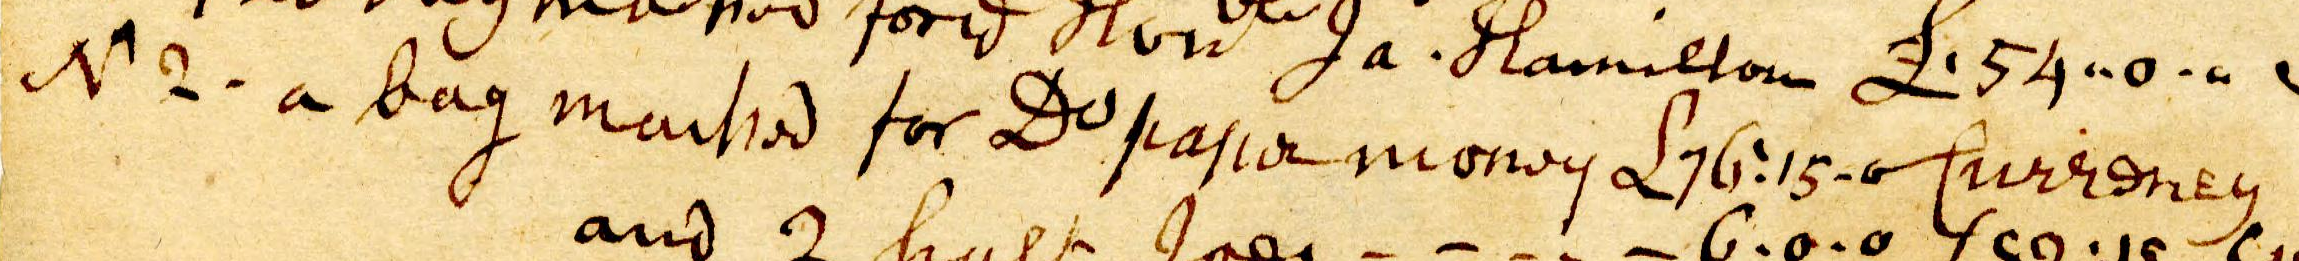N 2- a bag marked for D^o paper money £76..15.0 Currency
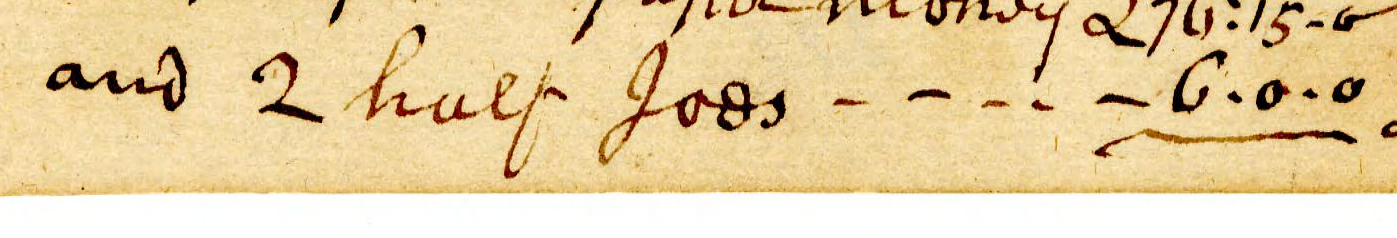and 2 half Joes-----6.0.0
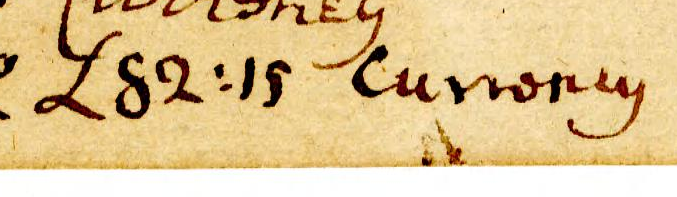£82..15 Currency
